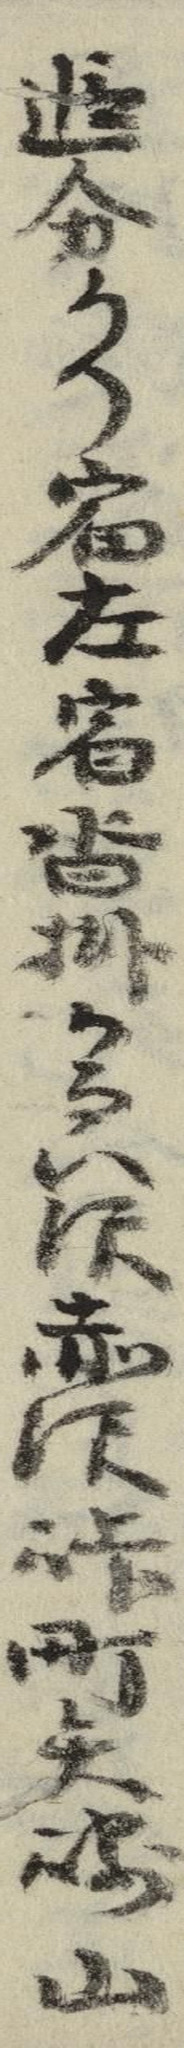追分かり宿左宿沓掛かるい沢赤沢峠町矢崎山

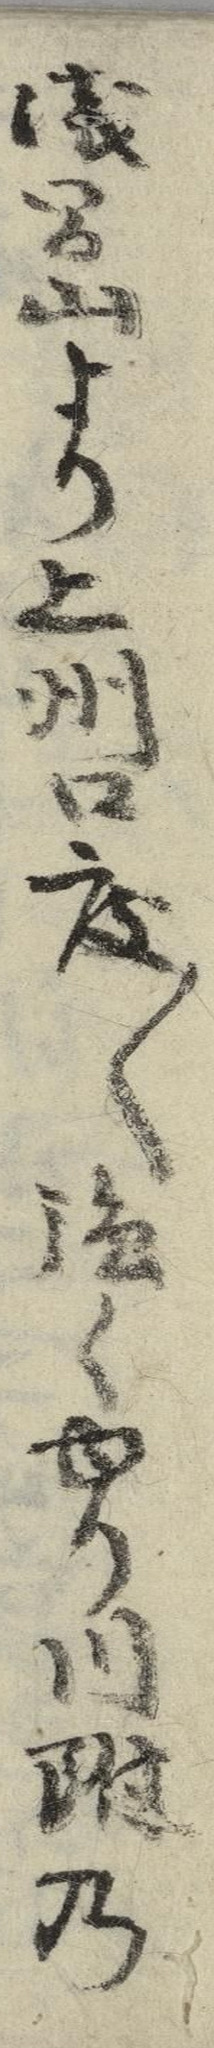浅間山より上州口度〳〵強くゆり川附乃
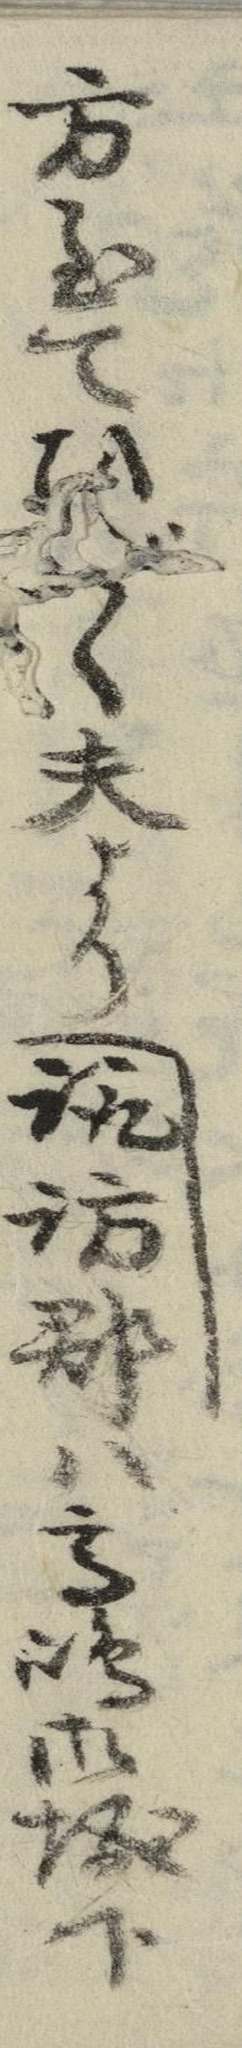方至てひどく夫より諏訪郡ハ高嶋御城下
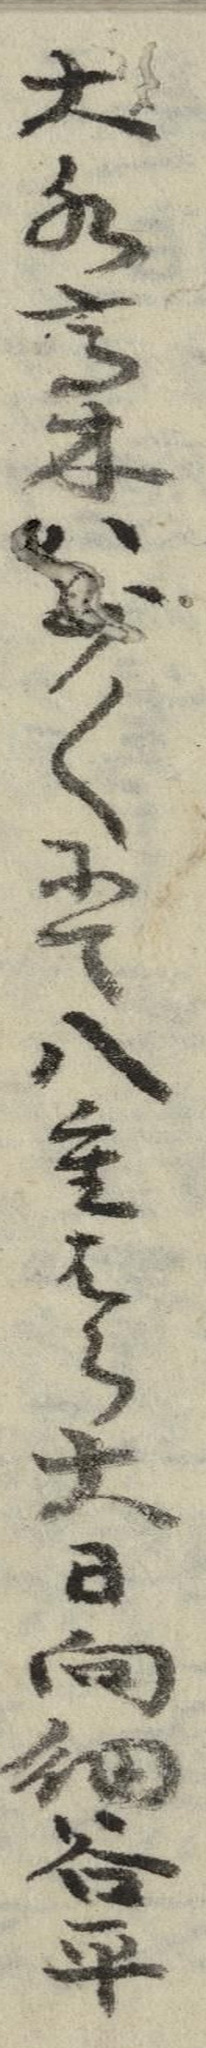大水高木ハ少〳〵にて八重はら大日向細谷平
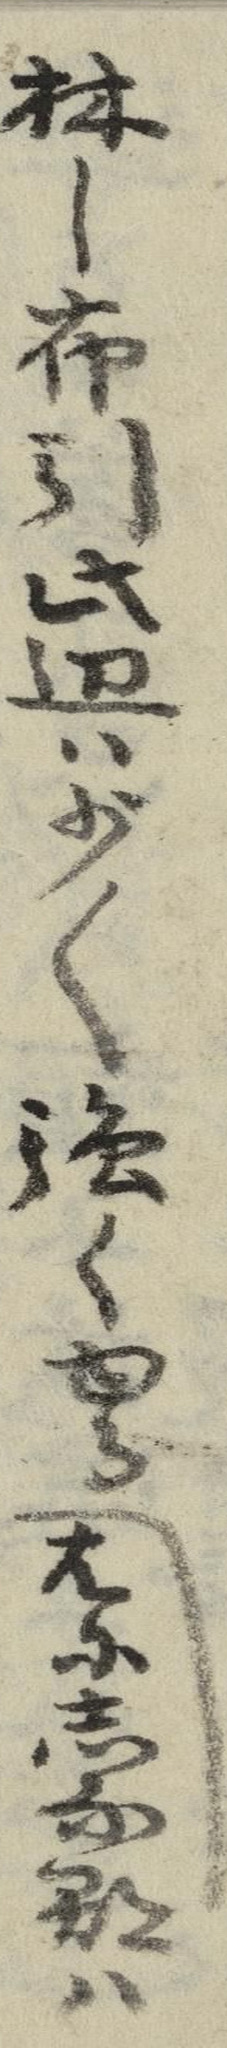林し布引此辺ハ少〳〵強くゆるはにしな郡ハ
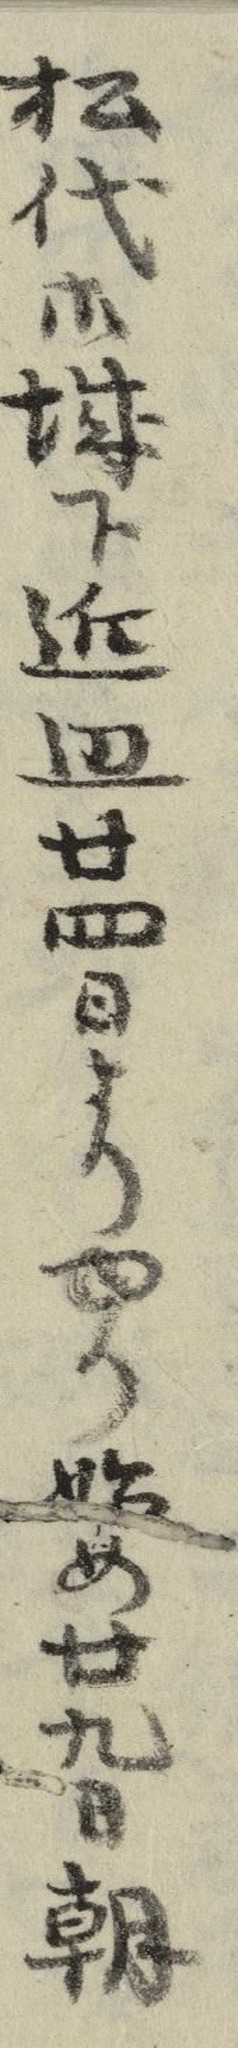松代御城下近辺廿四日よりゆり始め廿九日朝
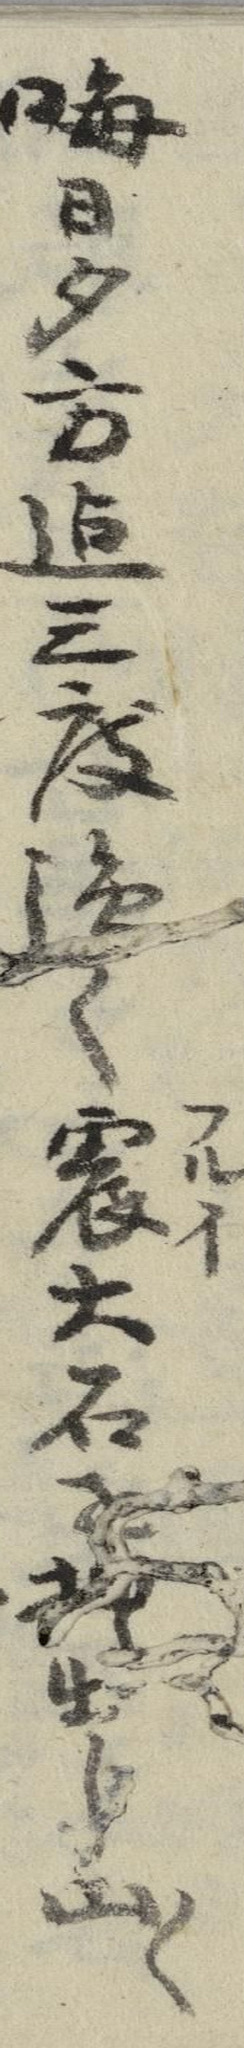晦日夕方迄三度強く震大石を押出し山〳〵
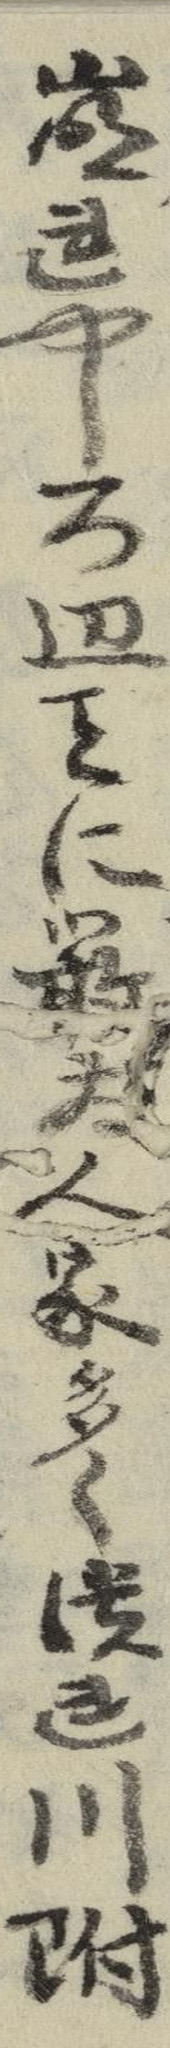崩連やしろ辺ことに厳敷人家多く潰れ川附
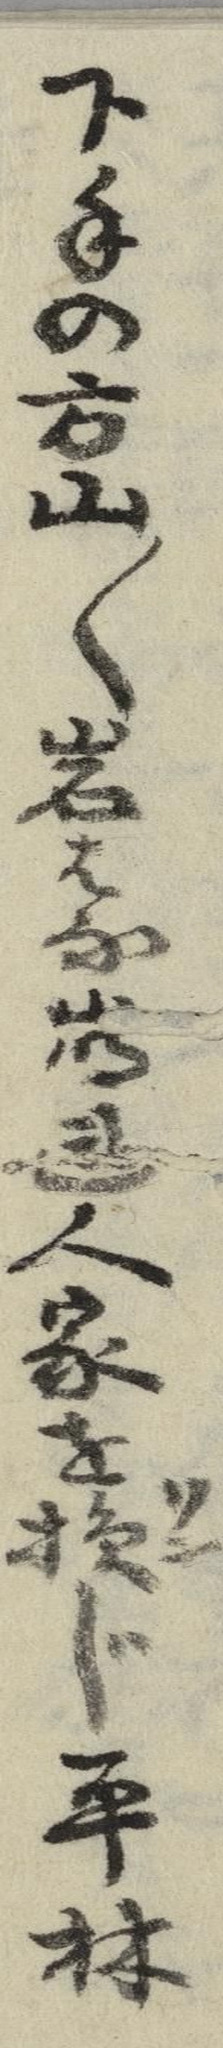下手の方山〳〵岩はな崩れ人家を損じ平林
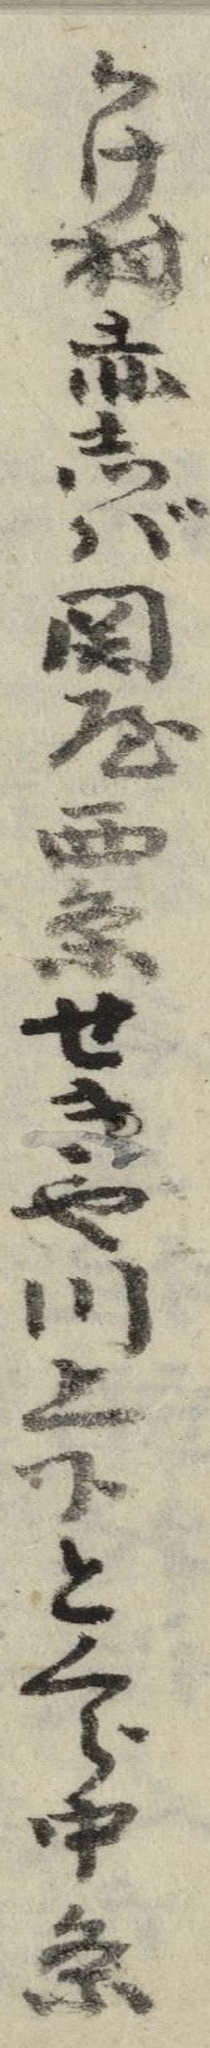かけ村赤しバ関屋西条せきや川上下とくら中条
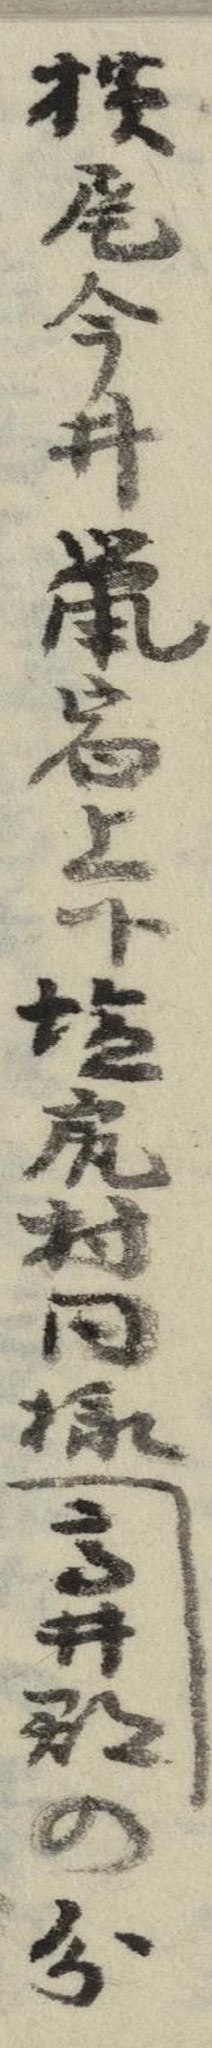横尾今井鼠宿上下塩尻村同様高井郡の分
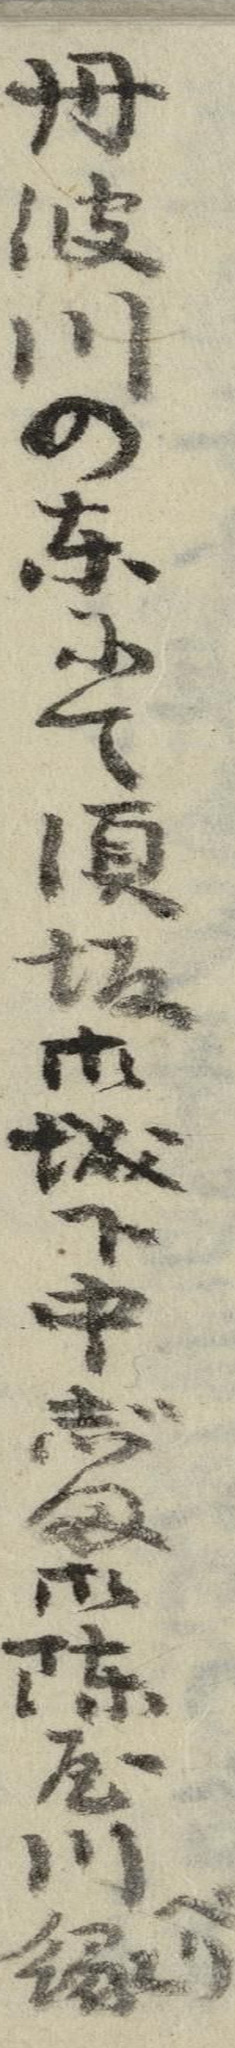丹波川の東にて須坂御城下中じま御陣屋川縁
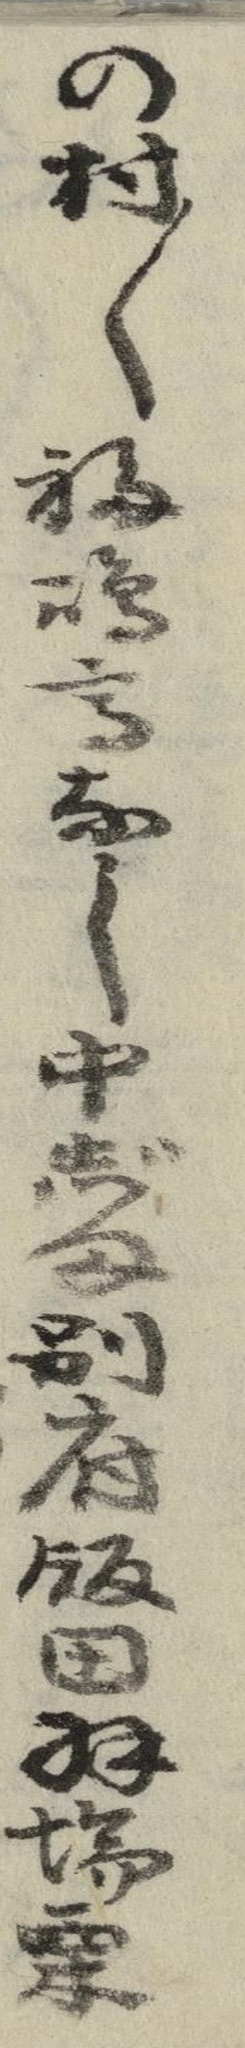の村〳〵福嶋高なし中じま別府飯田羽場栗
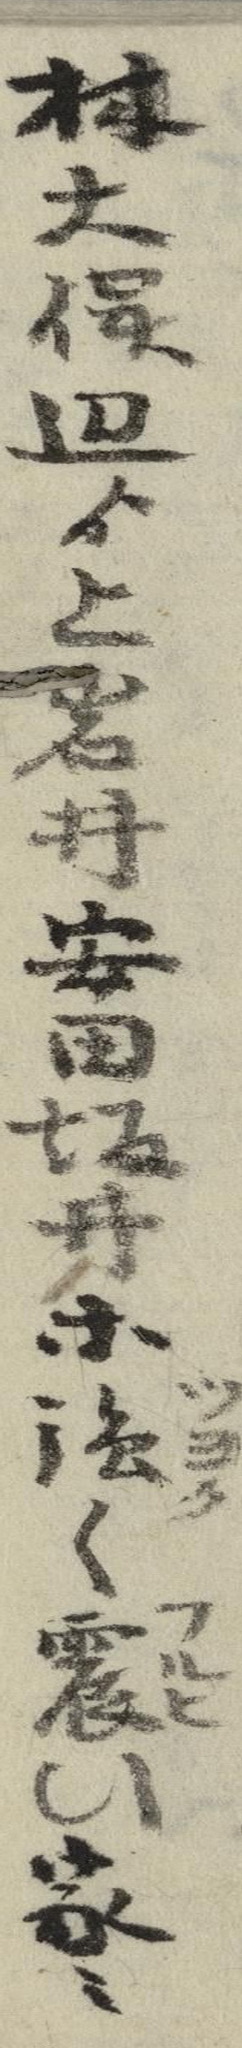林大俣辺ゟと岩井安田坂井等強く震ひ家々
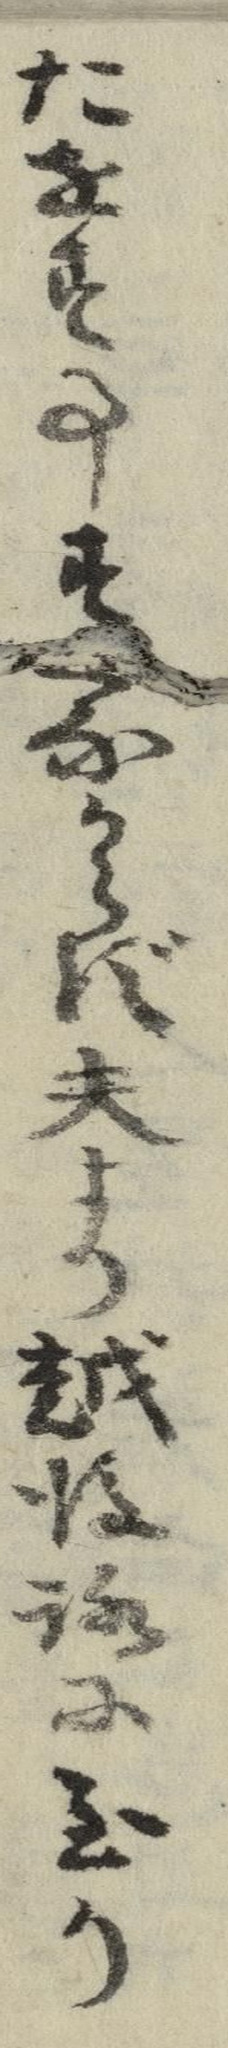たをす事すくなからず夫より越後路に至り
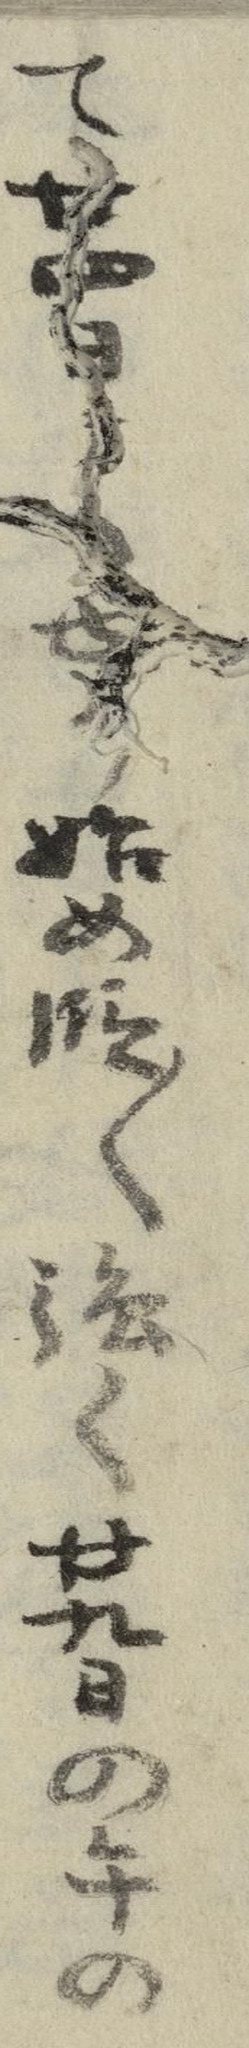て廿四日よりゆり始め段〳〵強く廿九日の午の
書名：信州大地震一件之冩　丁未弘化四年三月吉日
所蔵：東京大学地震研究所図書室 Earthquake Research Institute Library, The University of Tokyo, JAPAN
